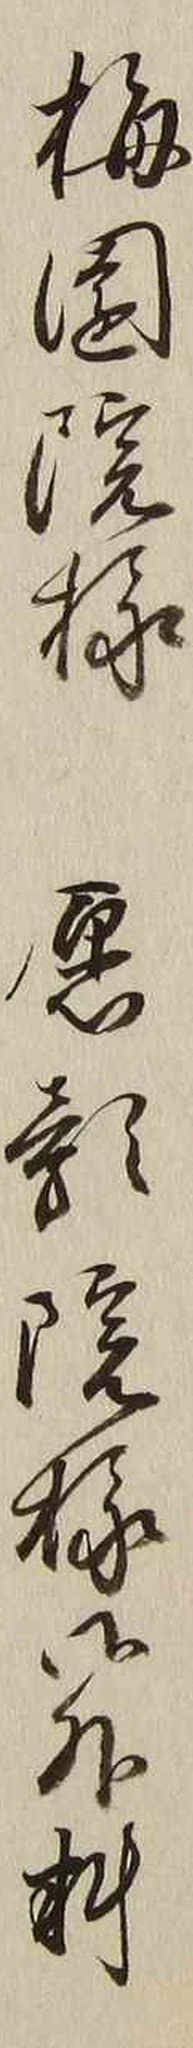梅園院様愿彰院様御外料
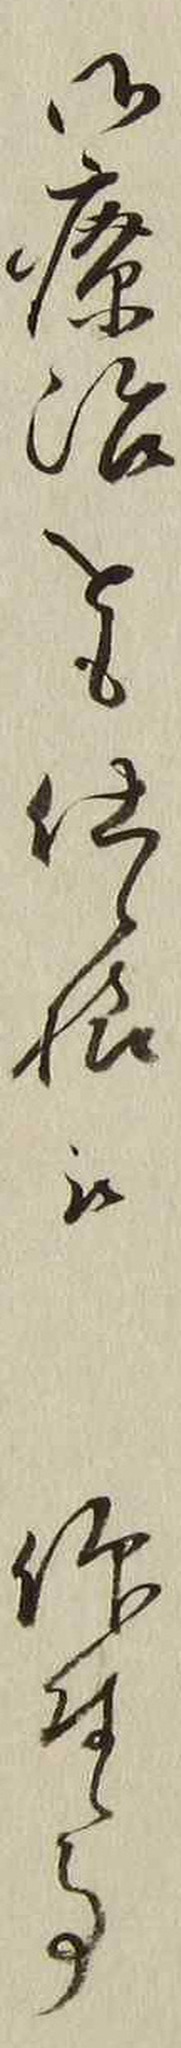御療治をも仕候様被仰付候事
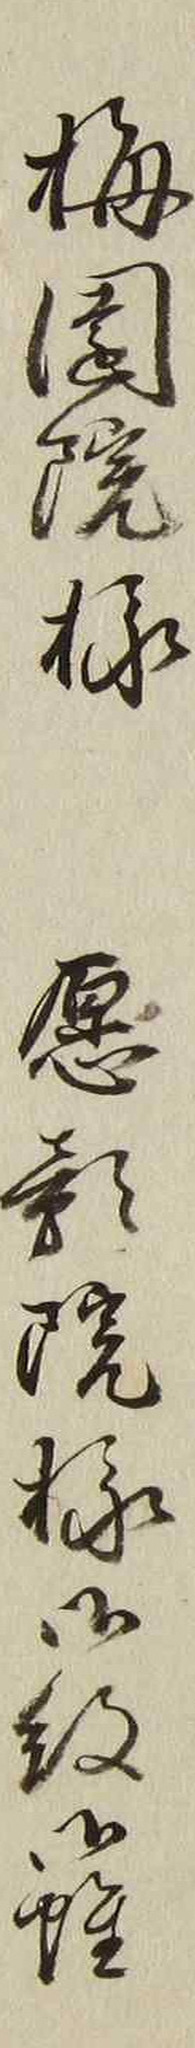梅園院様愿彰院様御紋御帷
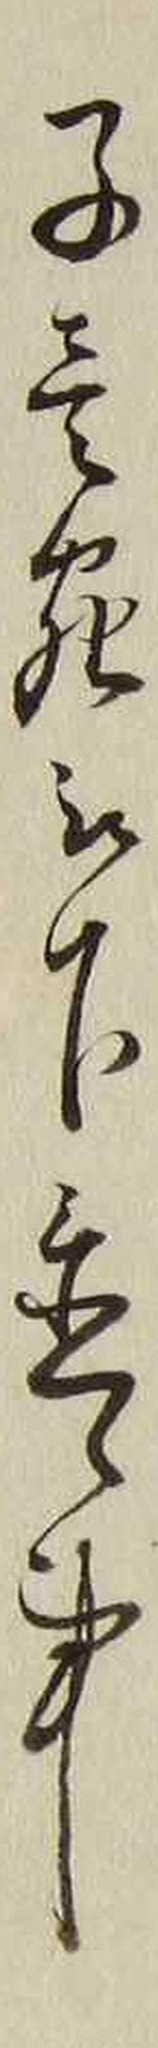子壱宛被下置候事
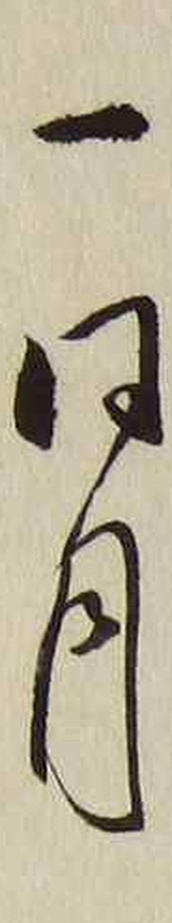一同月

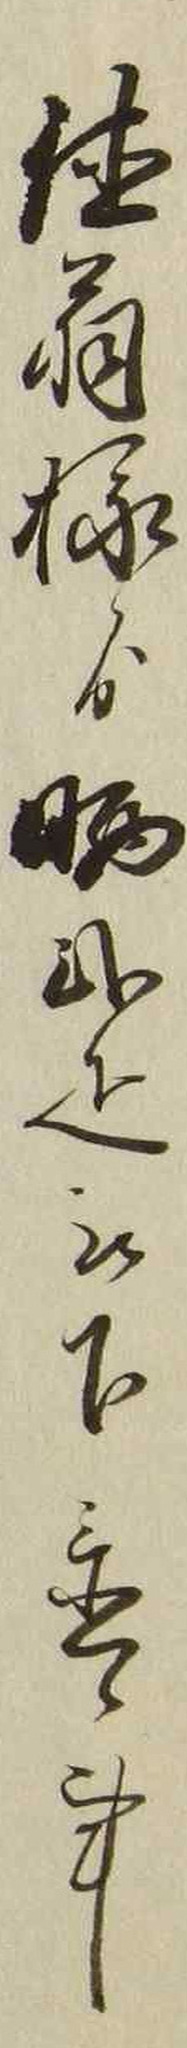徳翁様ゟ晒弐疋被下置候事
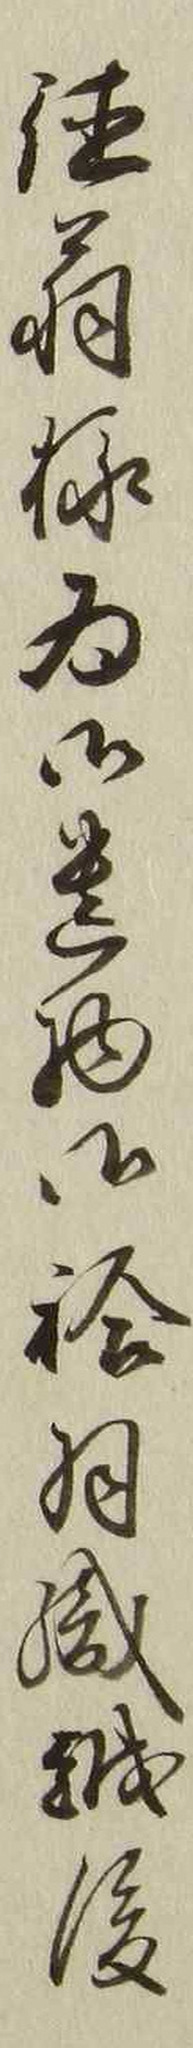徳翁様為御遺物御袷羽織越後
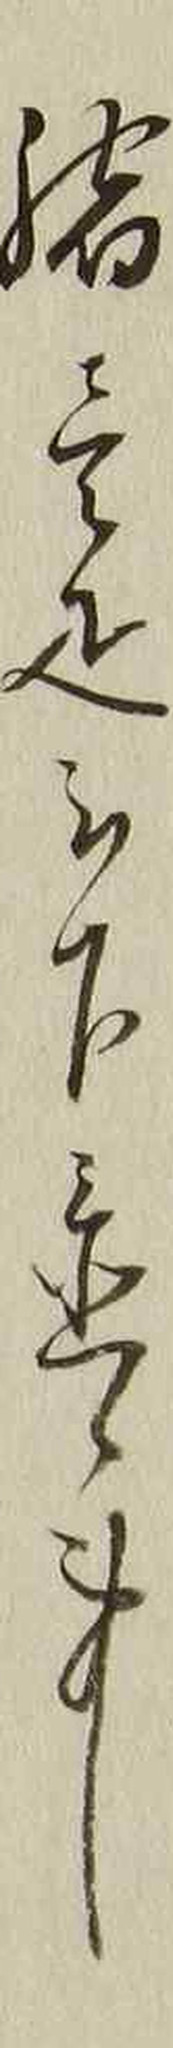絹壱疋被下置候事
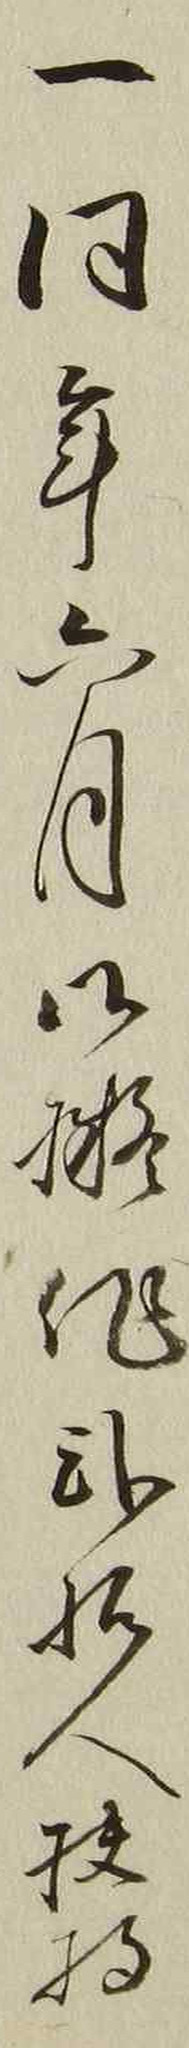一同年六月御擬作弐拾人扶持
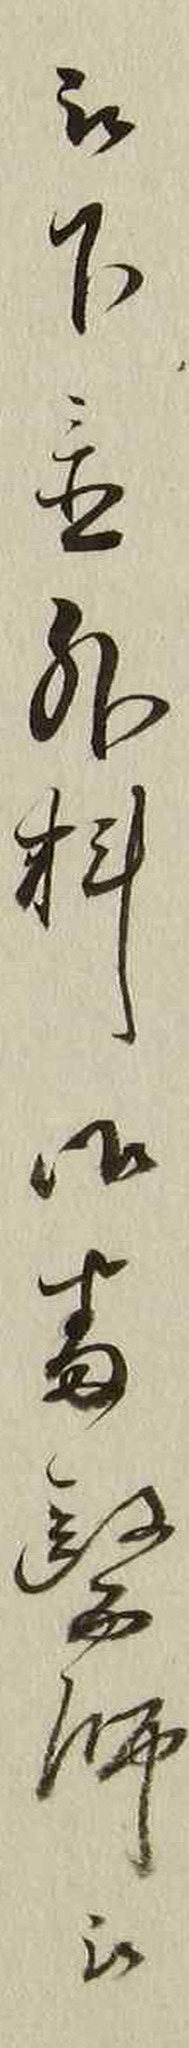被下置外料御番医師被
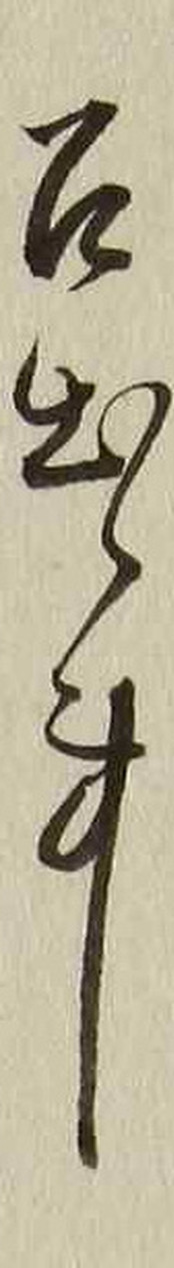召出候事
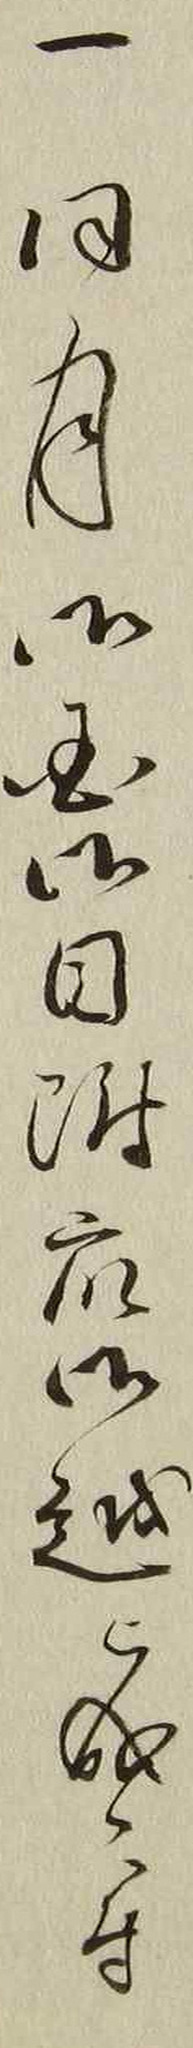一同月御国御目附衆御越被成候ニ付
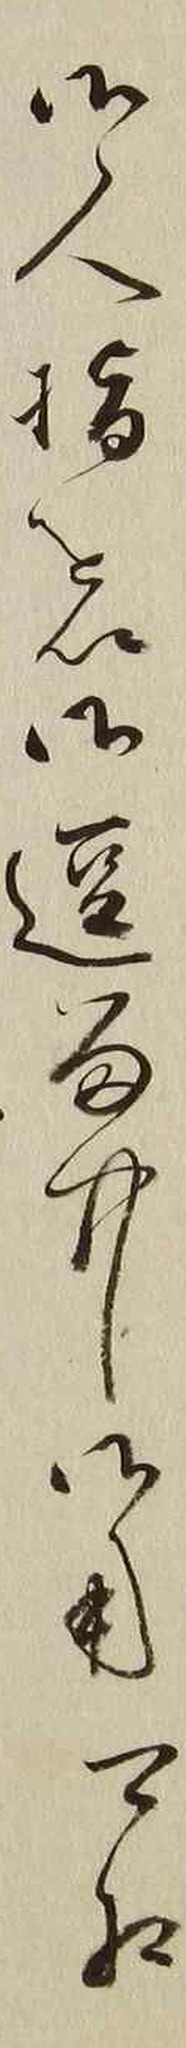御人指を以御逗留中御用可相
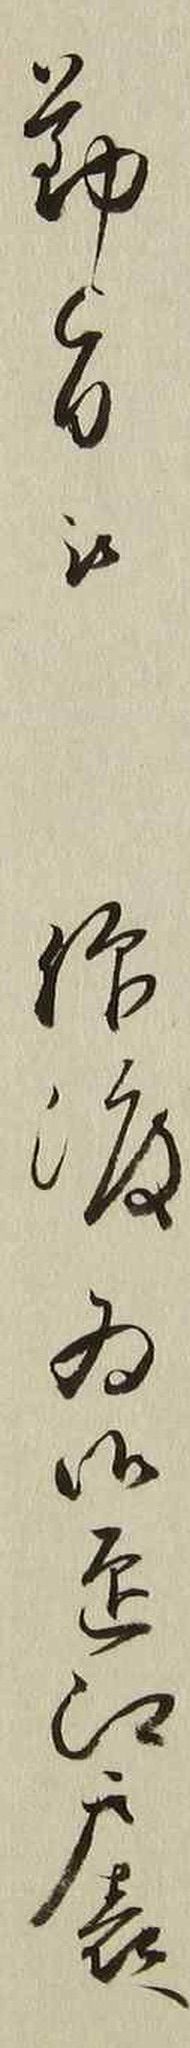勤旨被仰渡為御迎江戸表へ
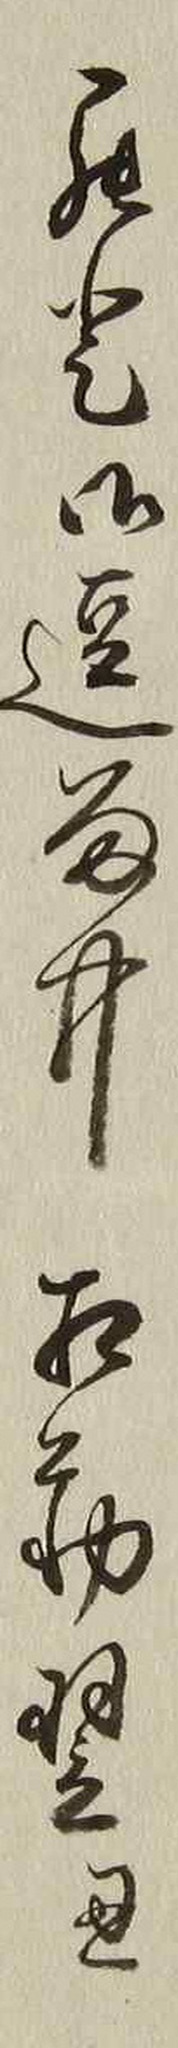罷登御逗留中相勤翌丑
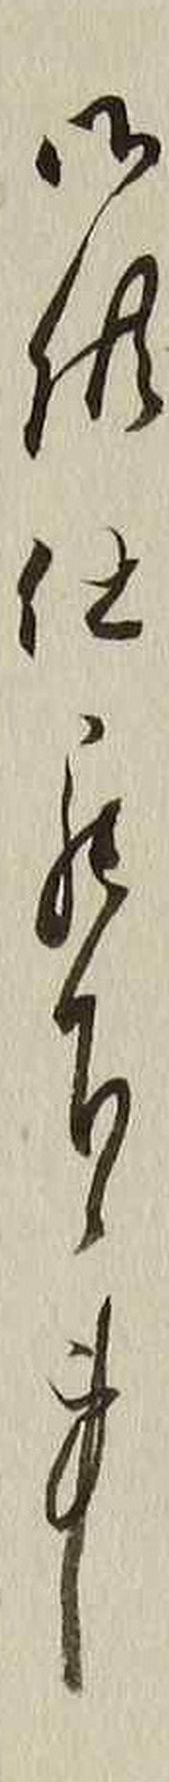御供仕罷下候事
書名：諸士系譜　巻之52　に之部3
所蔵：会津若松市立会津図書館
